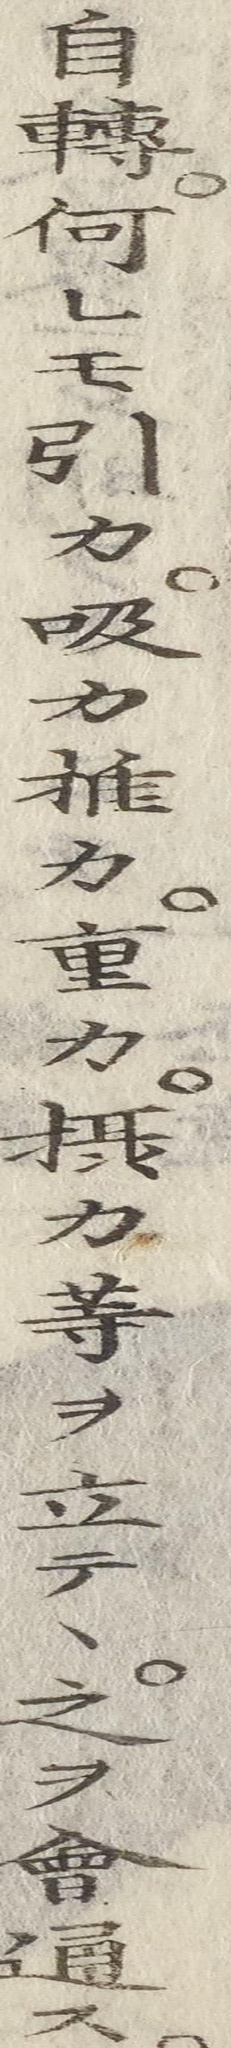自縛。何レモ引カ。吸カ推カ。重カ。摂カ等ヲ立テヽ。之ヲ会通ス。
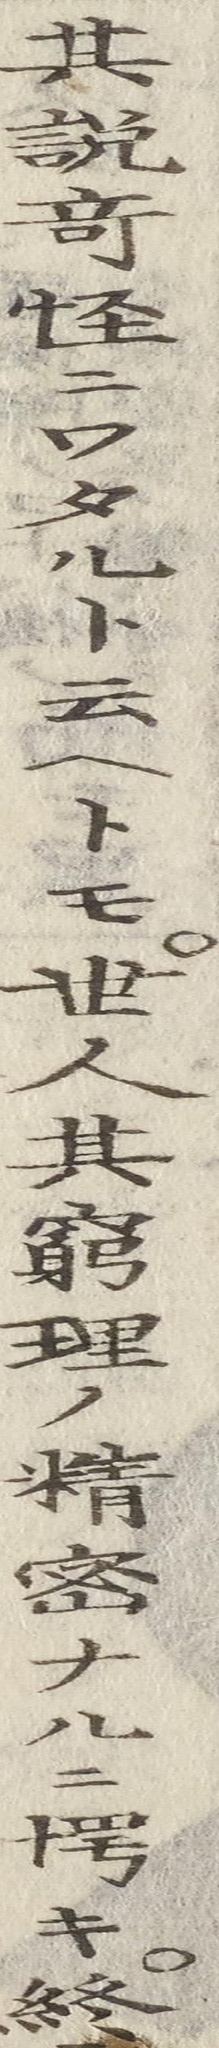其説奇怪ニワタルト云ヘトモ。世人其窮理ノ精密ナルニ愕キ。終ニ
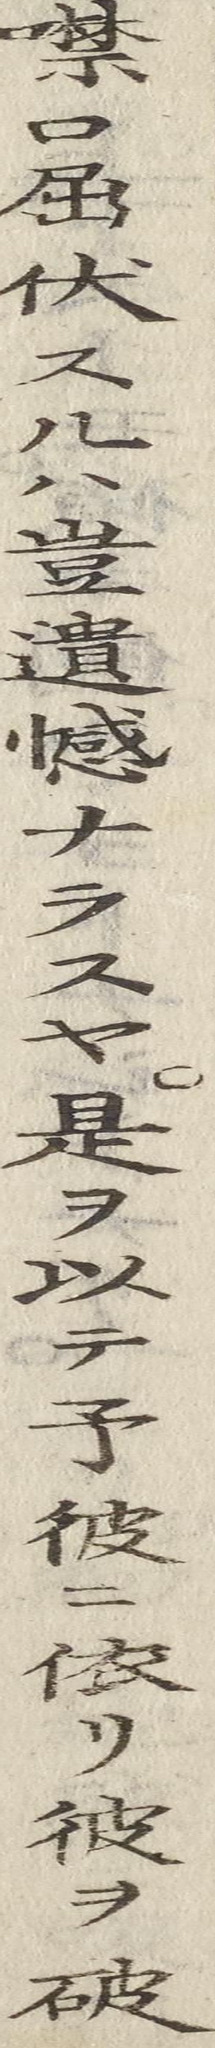噤口屈状スルハ豈遺憾ナラスヤ。是ヲ以テ予彼ニ依リ彼ヲ破
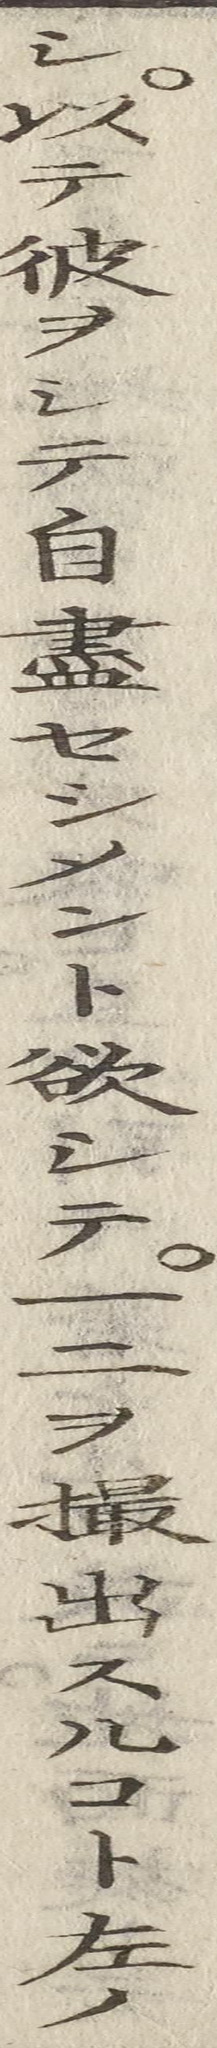シ。以テ彼ヲシテ自尽セシメント欲シテ。一二ヲ撮出スルコト左ノ
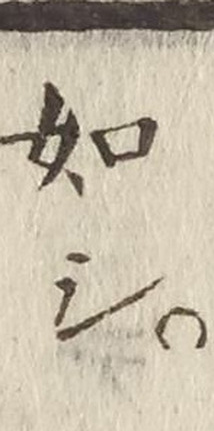如シ。
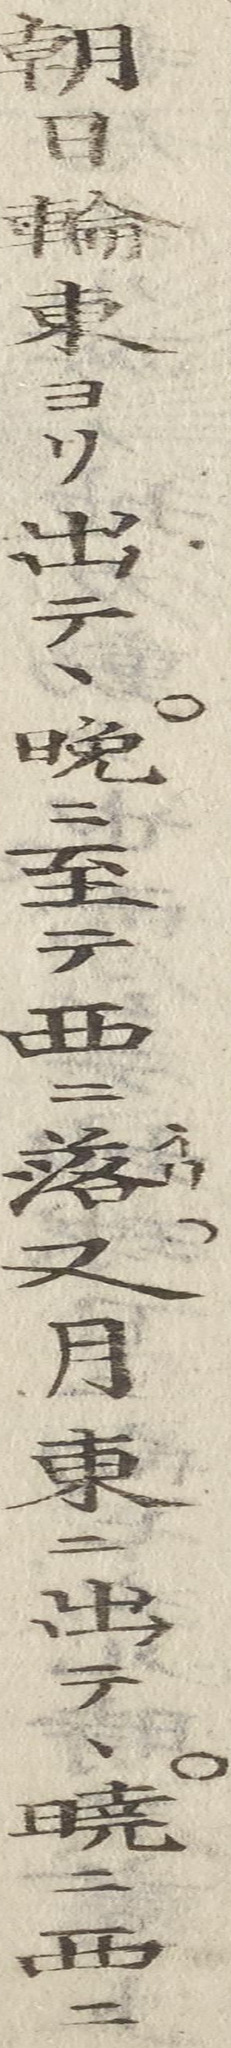朝日輪東ヨリ出テヽ。晩ニ至テ西ニ落。又月東ニ出テヽ。暁ニ西ニ
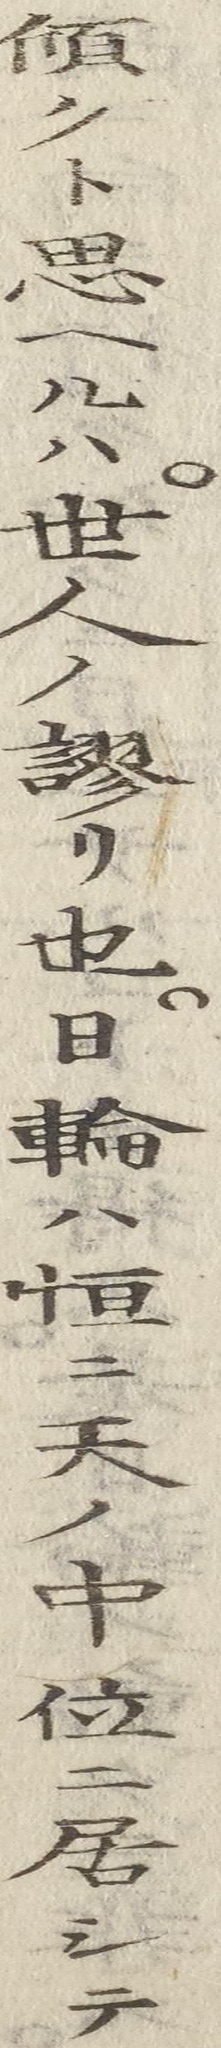傾クト思ヘルハ。世人ノ謬リ也。日輪ハ恒ニ天ノ中位ニ居シテ
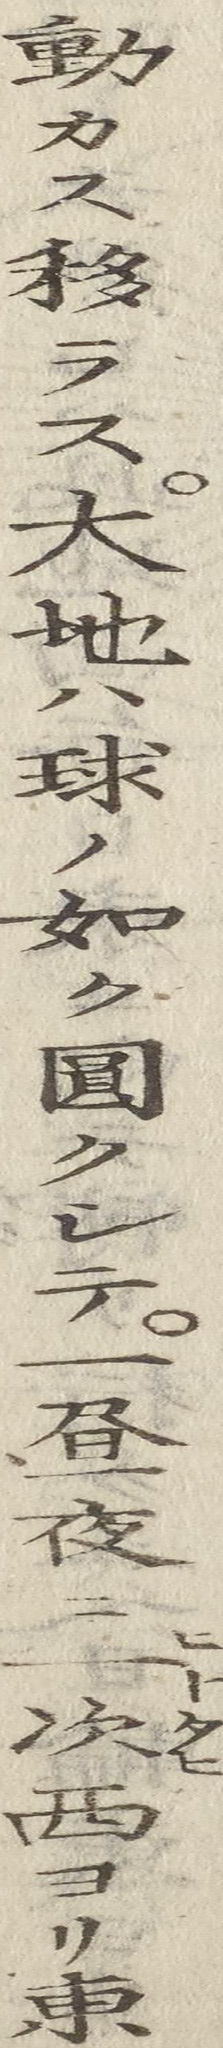動カス移ラス。大地ハ球ノ如ク円クシテ。一昼夜ニ一次西ヨリ東
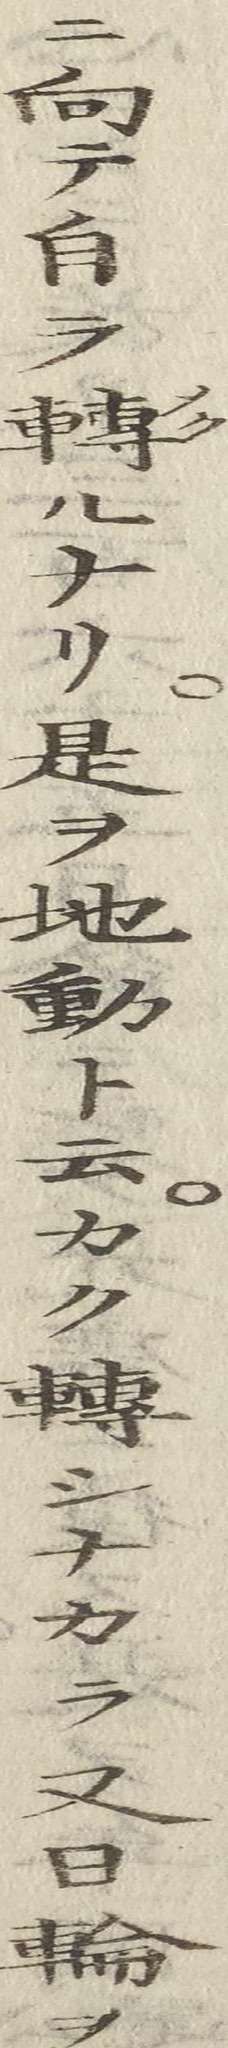ニ向テ自ラ転ルナリ。是ヲ地動ト云。カク転シナカラ又日輪ヲ

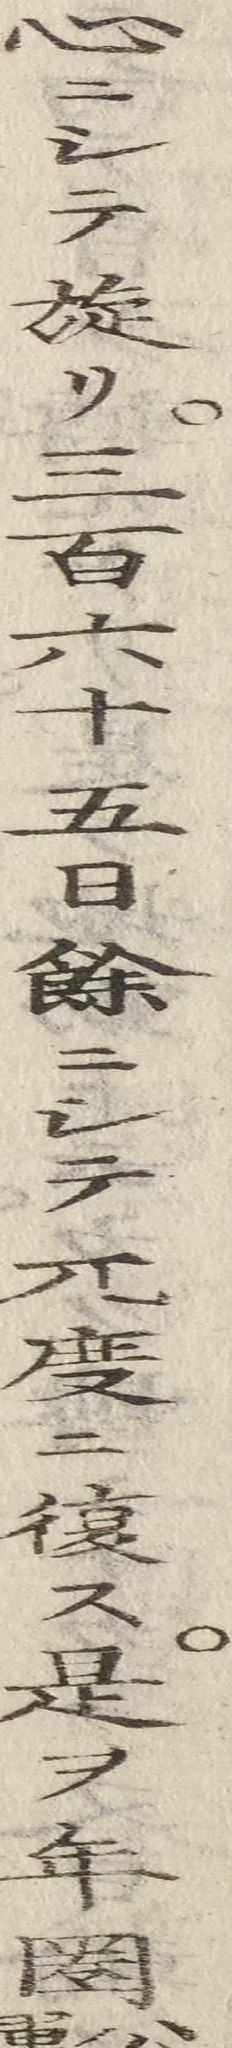心ニシテ旋リ。三百六十五日余ニシテ兀度ニ復ス。是ヲ年圏公運
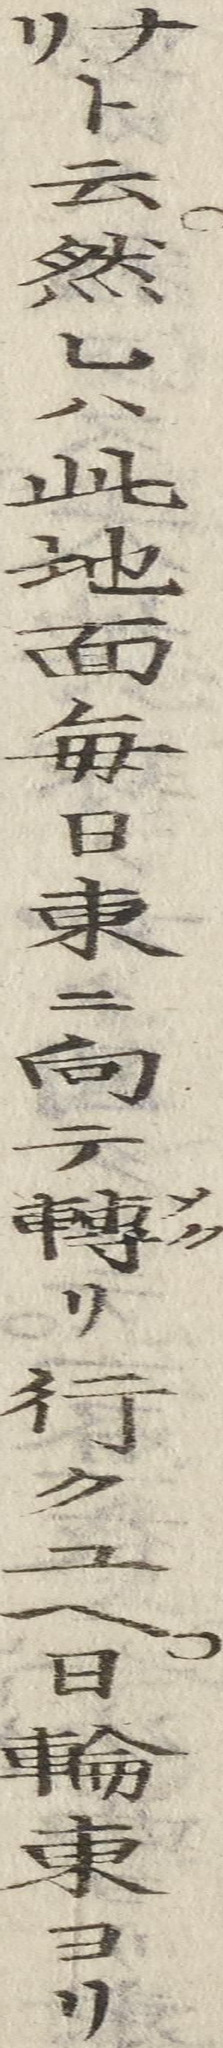ナリト云。然レハ此地面毎日東ニ向テ転リ行クユヘ。日輪東ヨリ
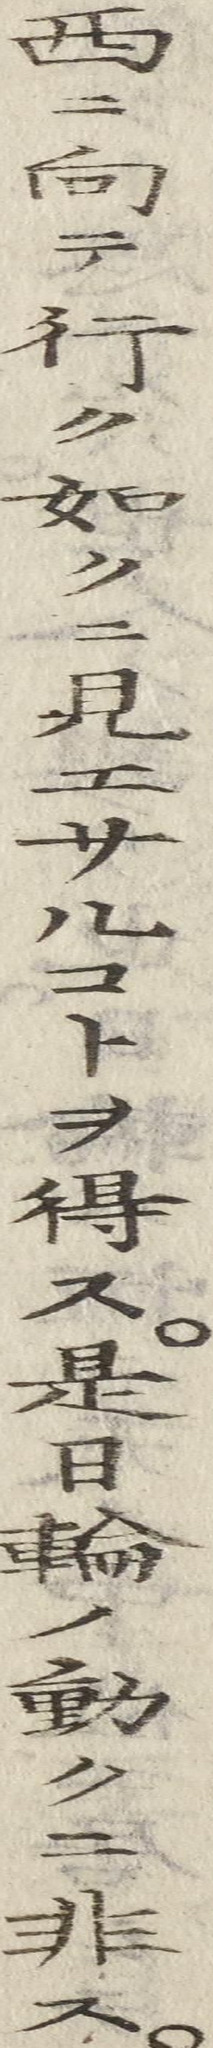西ニ向テ行ク如クニ見エサルコトヲ得ス。是日輪ノ動クニ非ス。
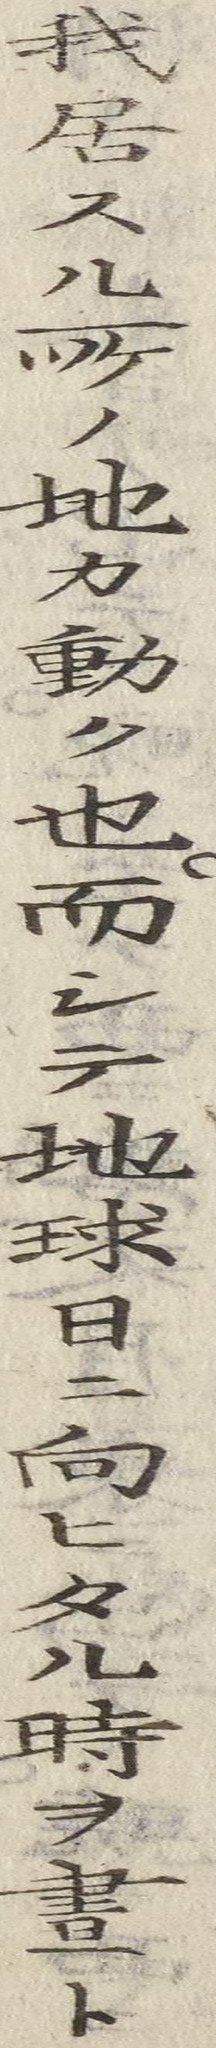我居スル所ノ地カ動ク也。而シテ地球日ニ向ヒタル時ヲ画ト
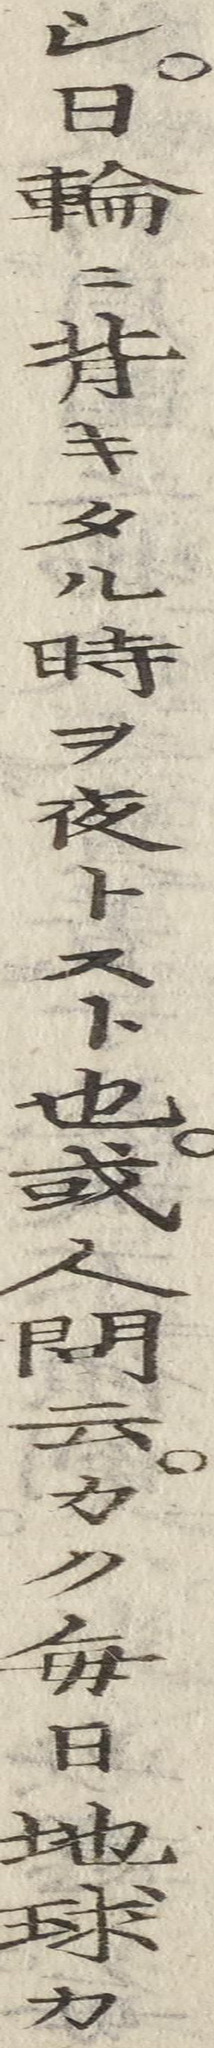シ。日輪ニ背キタル時ヲ夜トスト也。或人問云。カク毎日地球カ
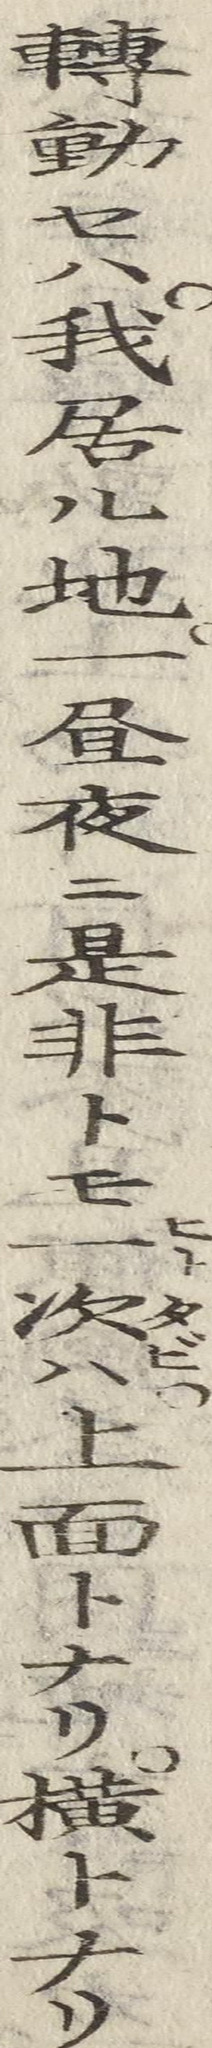転動セハ。我居ル地。一昼夜ニ是非トモ一次ハ。上面トナリ。横トナリ
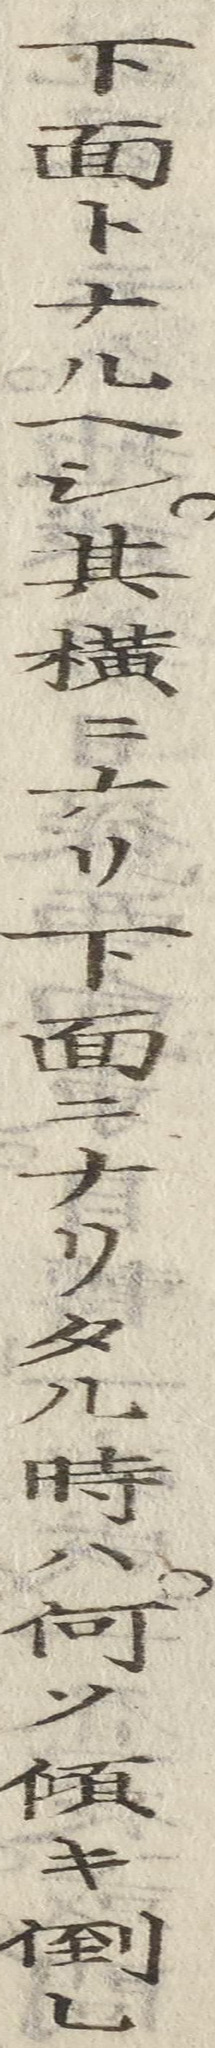下面トナルヘシ。其横ニナリ下面ニナリタル時ハ。何ソ傾キ倒レ
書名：護法新論　中
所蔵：東京大学地震研究所図書室 Earthquake Research Institute Library, The University of Tokyo, JAPAN
